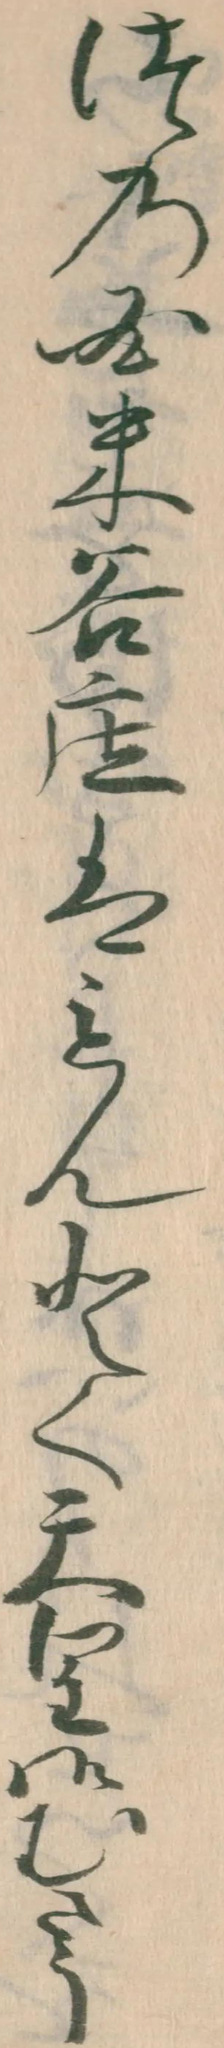つの国米谷庄はもんとく天皇御むさう
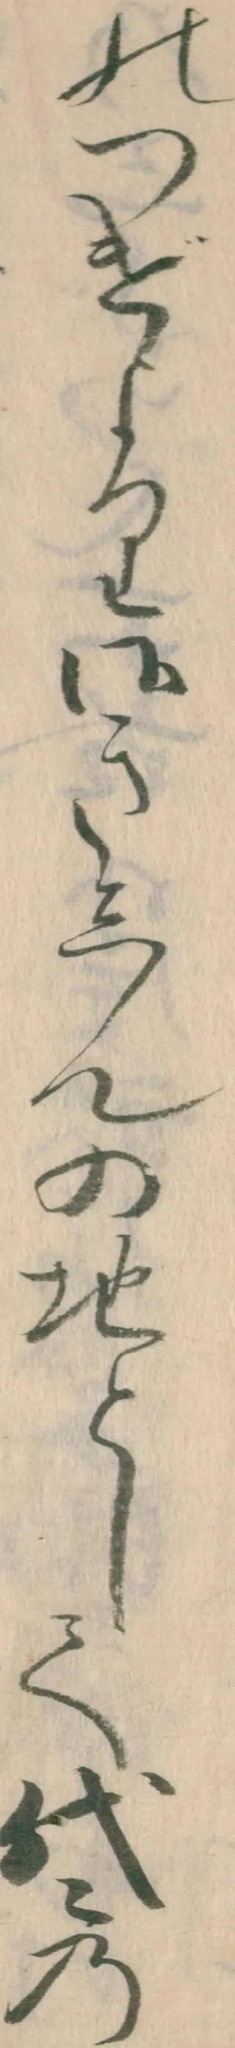のつげより御きしんの地として代々の
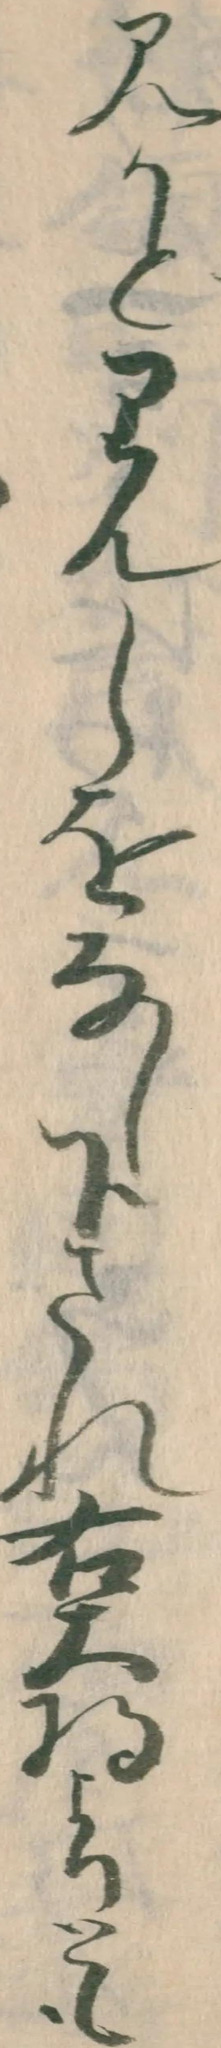みかどりんしをなし下され右大将よりとも
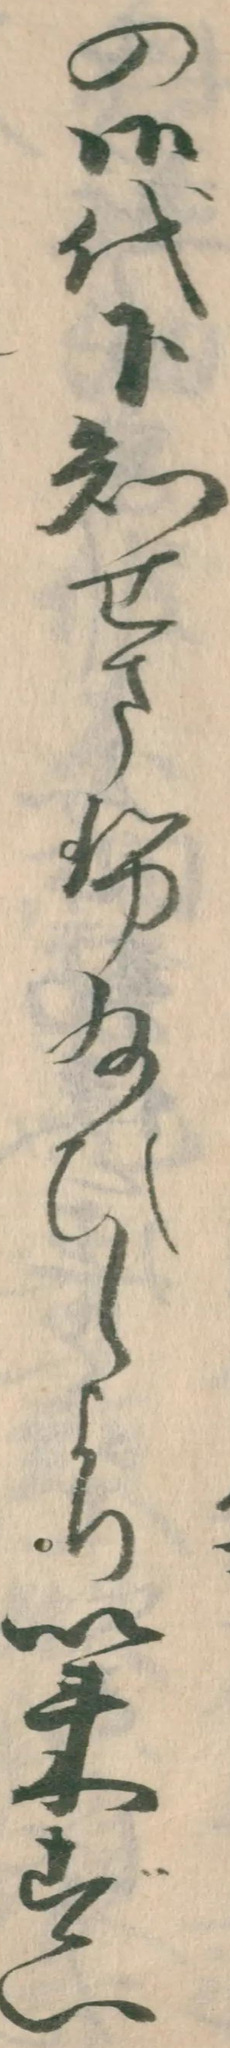の御代下知せさせ給ひしより以来ずい
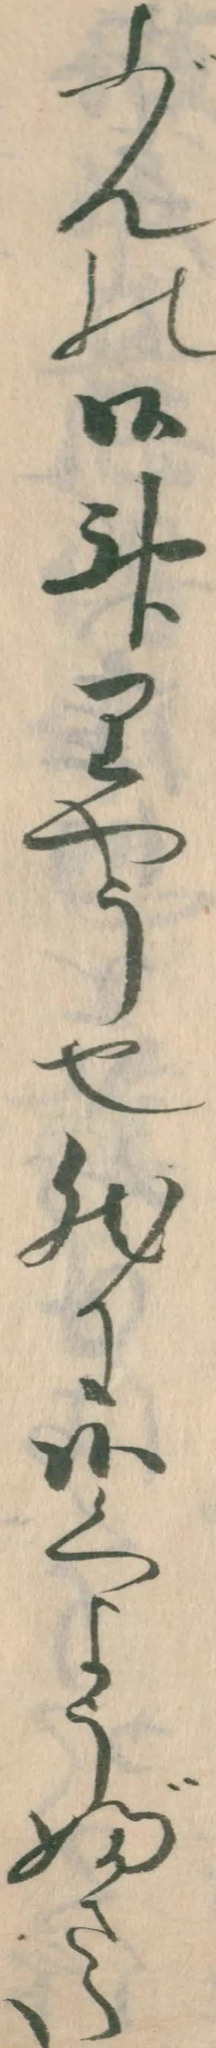ぶんの御神りやう也然に御くようぶさた
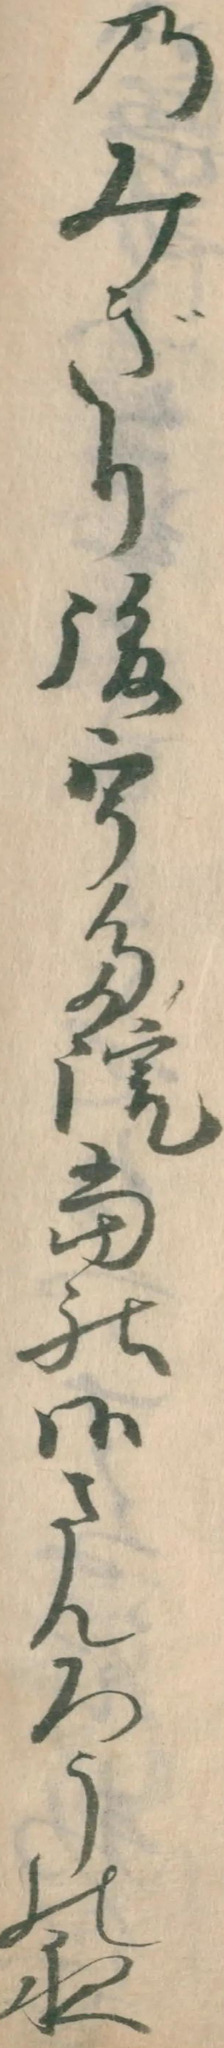のみぎり後宇多院当社御さんろうの夜

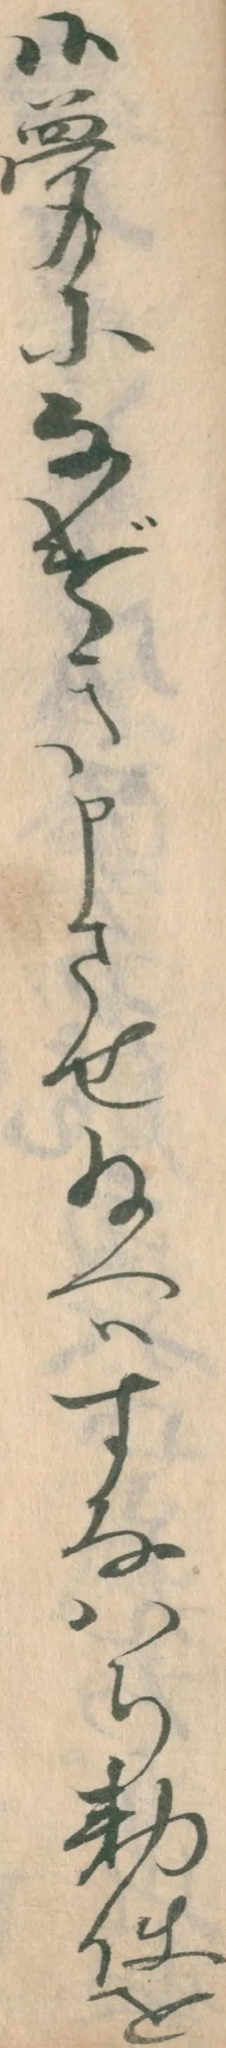御夢になげき申させ給へはすなはち勅使を
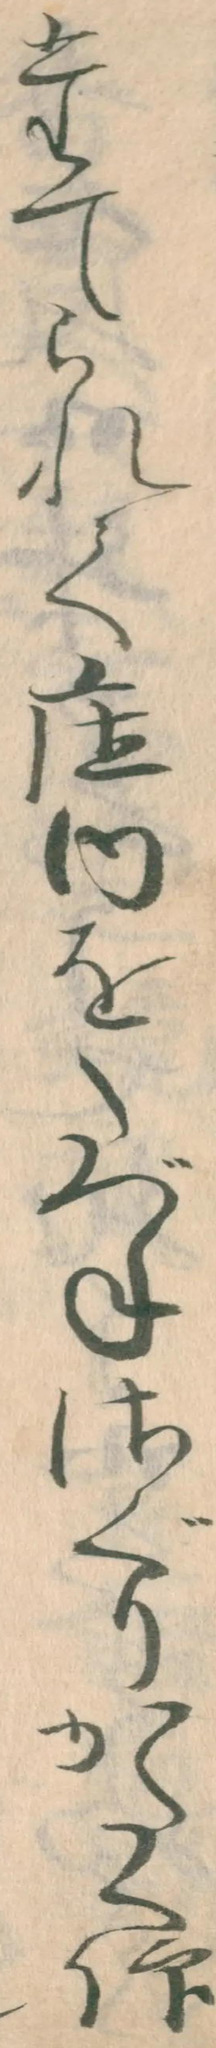たてられて庄内をたづねさぐりかたく仰
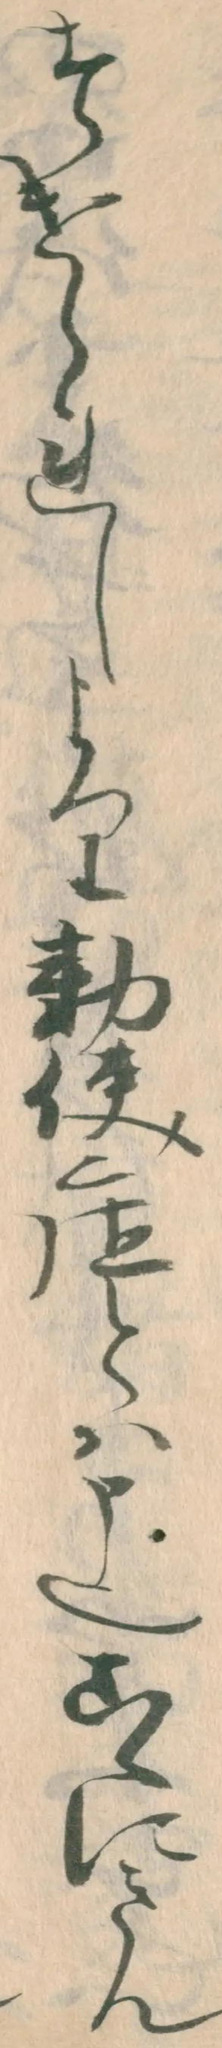つけられしより勅使庄とは申也こゝにきん
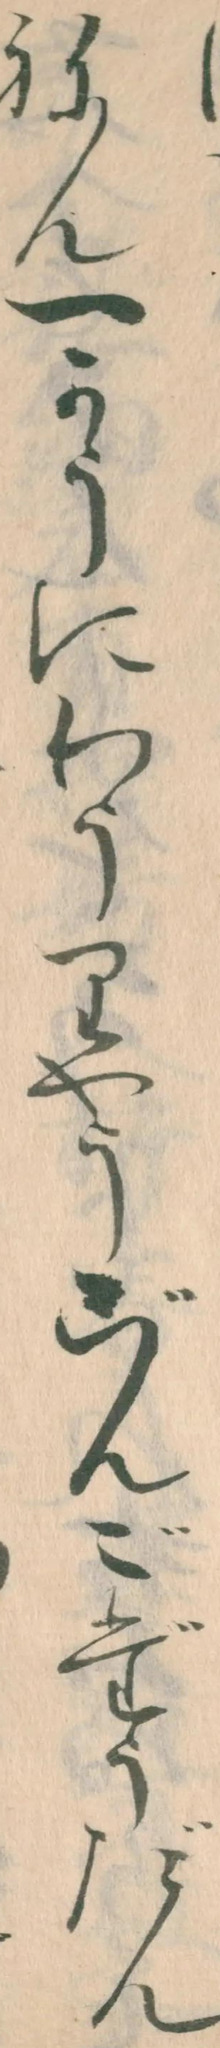ねん一かうにわうりやうごんごだうだん
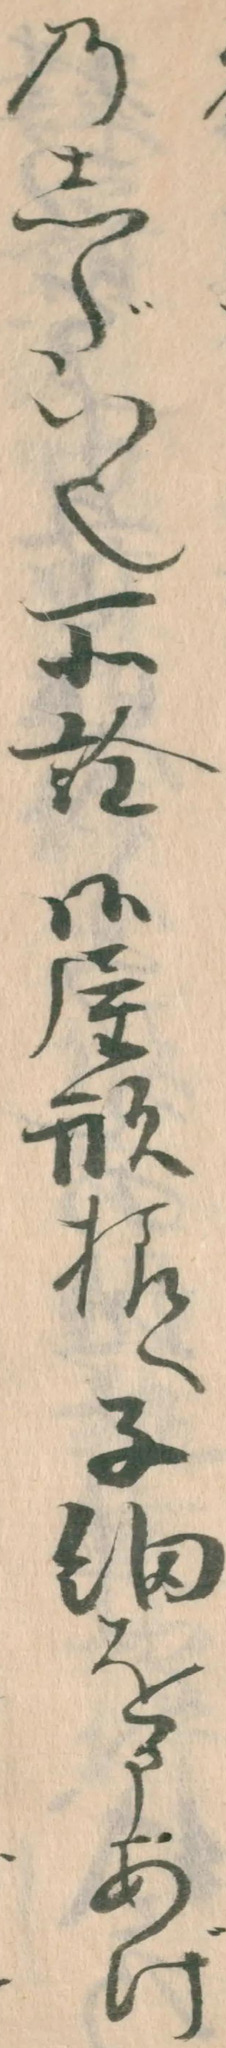のしだい也所詮御屋形様へ子細を申あげ
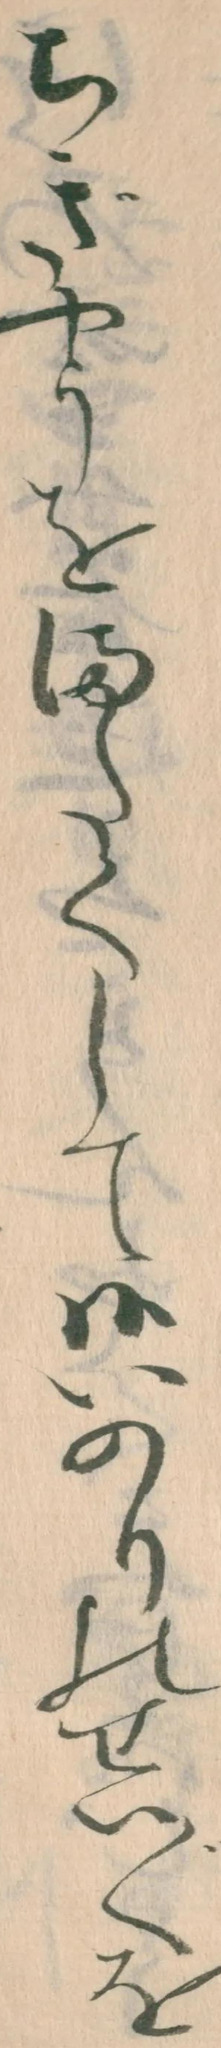ちぎやうをまたくして御いのりのせい〴〵を
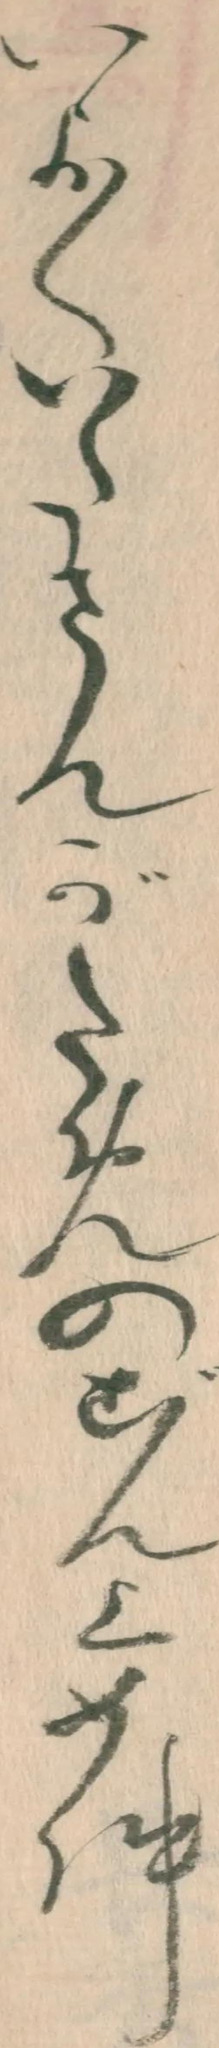いよ〳〵いたさんがためのごん上如件
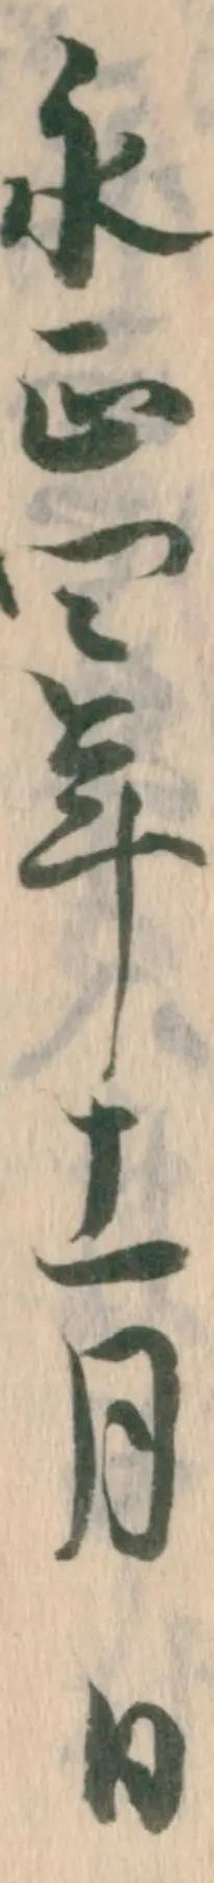永正四年十一月日
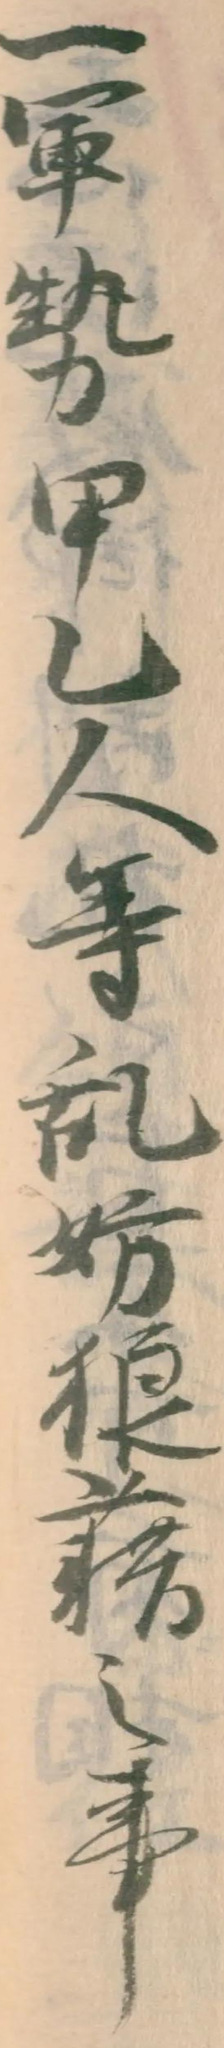一軍勢甲乙人等乱妨狼藉之事
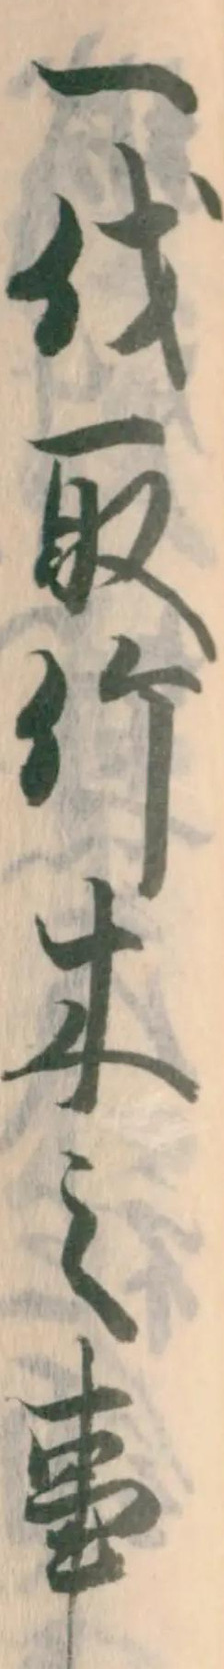一伐取竹木之事
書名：賀茂社記録. 第1冊
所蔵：国立国会図書館 National Diet Library, JAPAN
